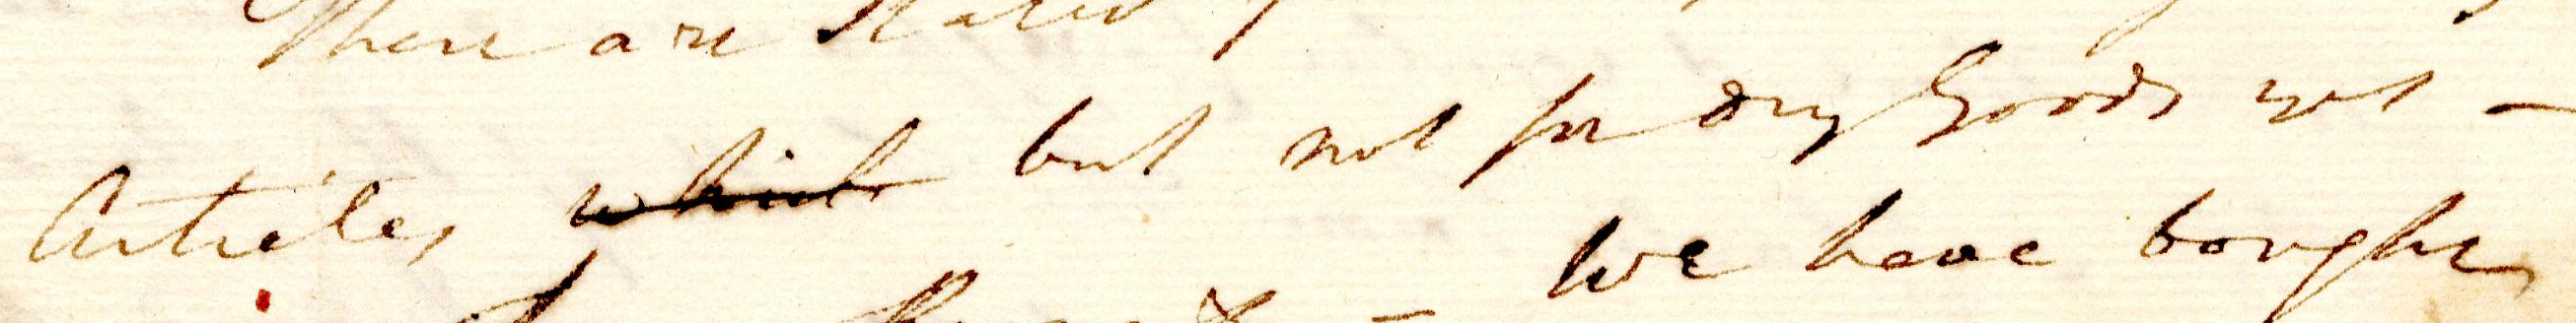Articles, which but not for dry Goods yet
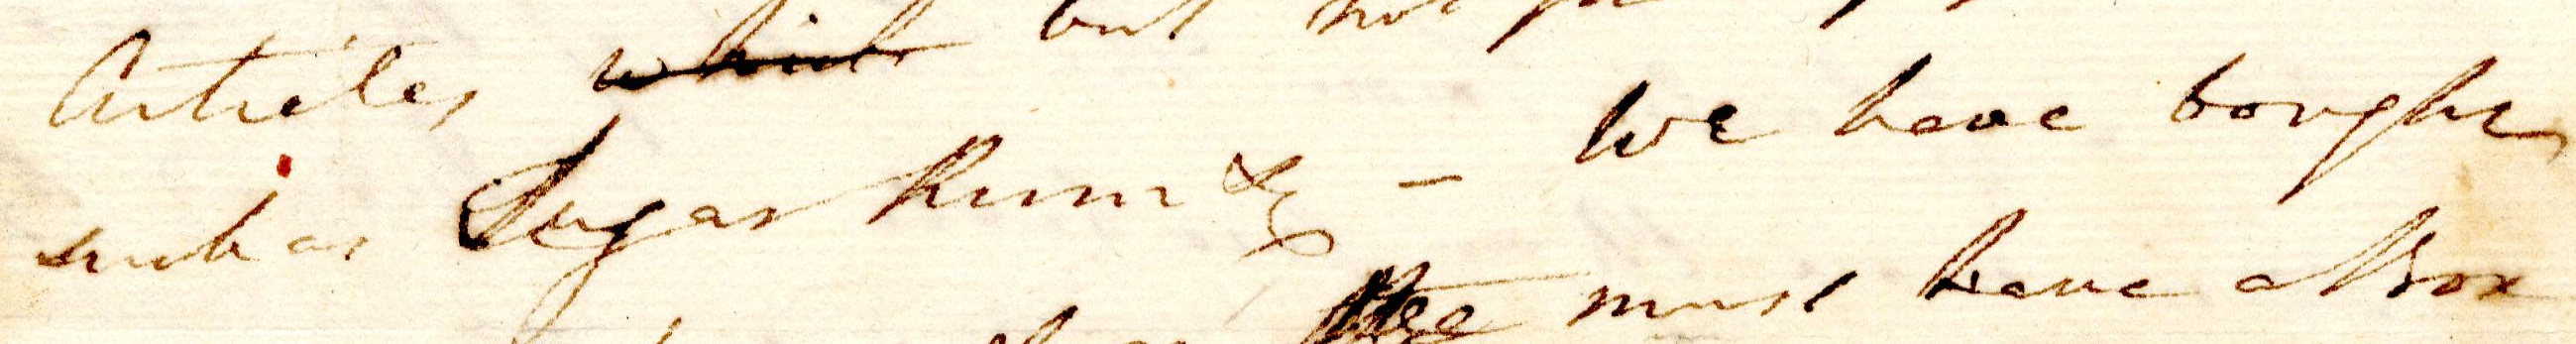wribar Sugar Rum &c.- We have bought
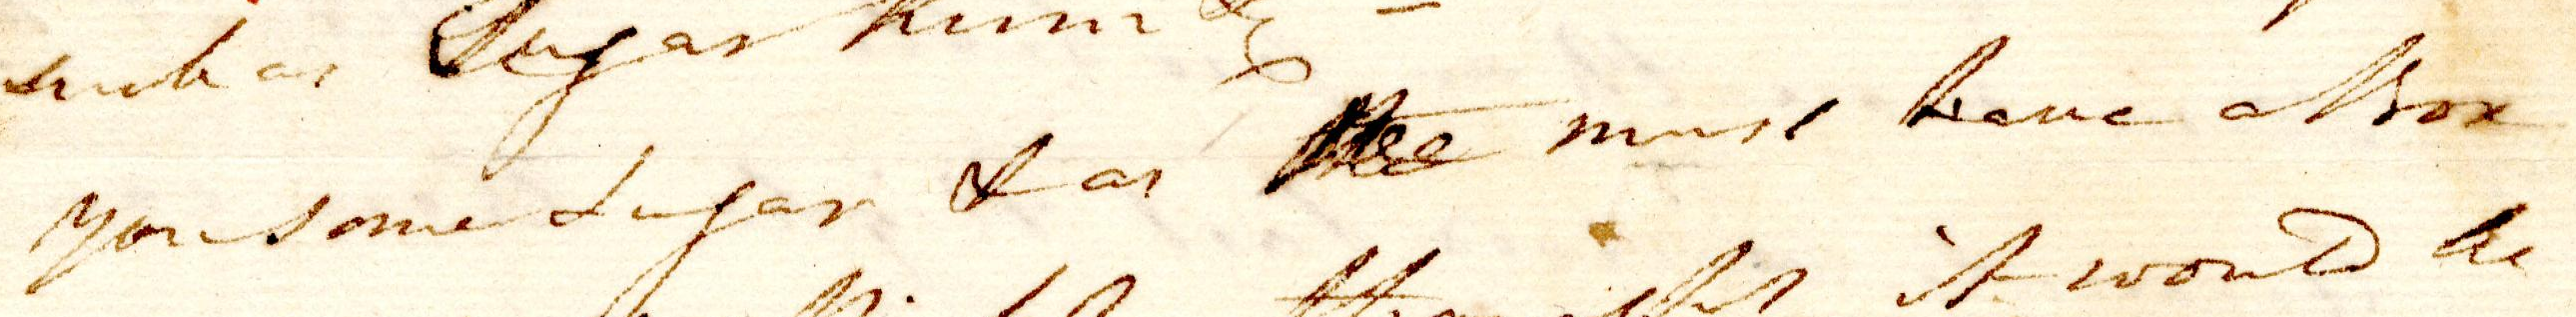you some Sugar & as the must have a Box
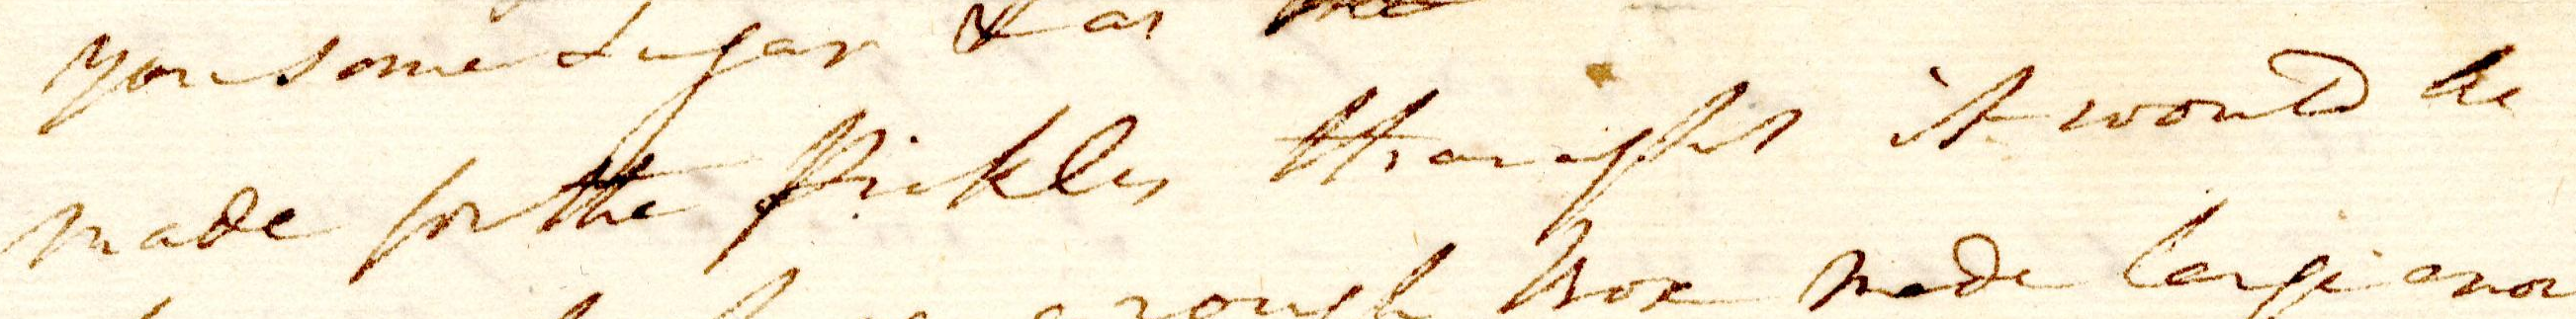made for the Pickles thought it would be
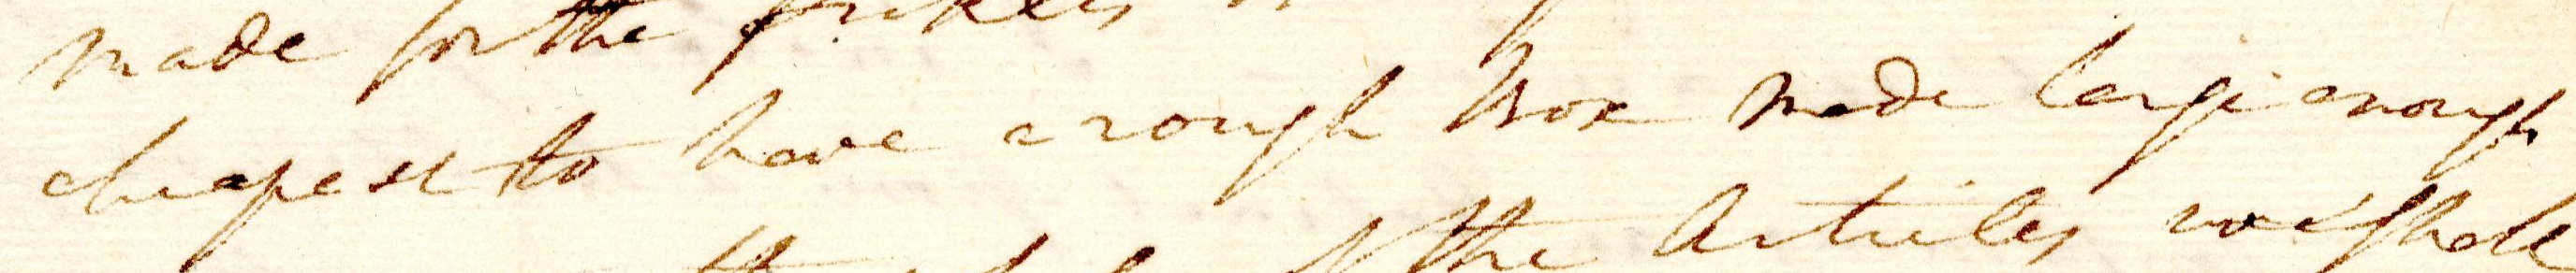cheapest to have enough Box made large enough
